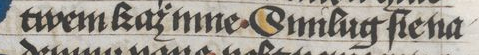twem każ mne.Smilug ſie na¬
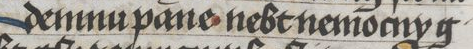demnu pane.nebt nemocny g¬
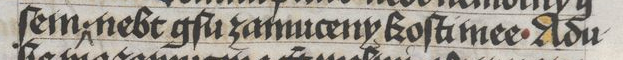ſem.nebt gſu zarmuceny koſti mee.Adu¬
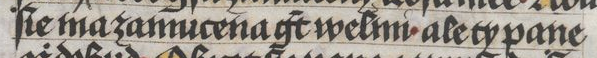ẛie ma zarmucena ḡt welmi.ale ty pane
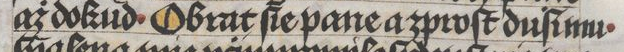aż dokud.Obrat ſie pane a zproſt duẛi mu.
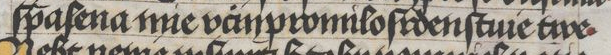ſpalena mie uċini promiloſrdenſtvie twe.
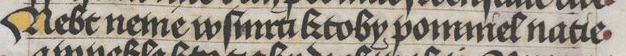Nebt nenie wſmrti ktoby pomniel natie.
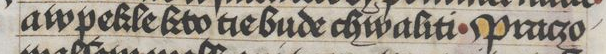a w pekle kto tie bude chwaliti.Praczo
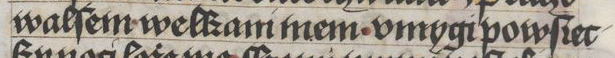walſem.welkani mem.umygi powſiet¬
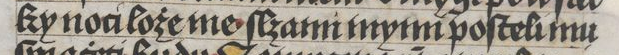ky noci loże me.ſlzami mymi poſteli mu
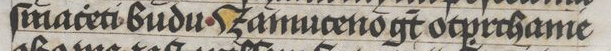ſmaċeti budu.Zarmuceno ḡt otprchanie
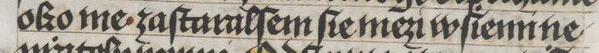oko me.zaſtaralſem ſie mezi wẛiemi ne¬
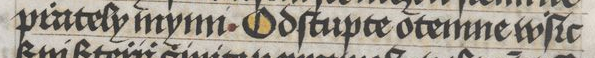pṙately mymi.Odſtupte otemne wẛic¬
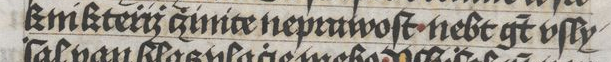kni kteṙiż cżinite neprawoſt.nebt ḡt vſly¬
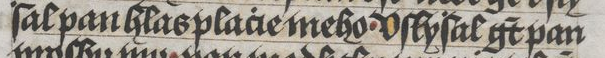ẛal pan hlas plaċie meho.Uſlyſal ḡt pan
